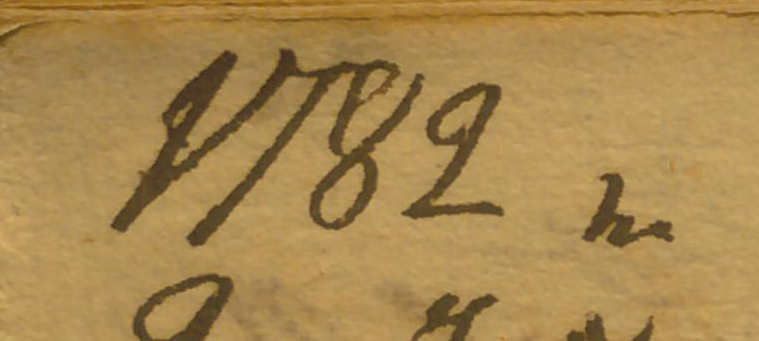1782
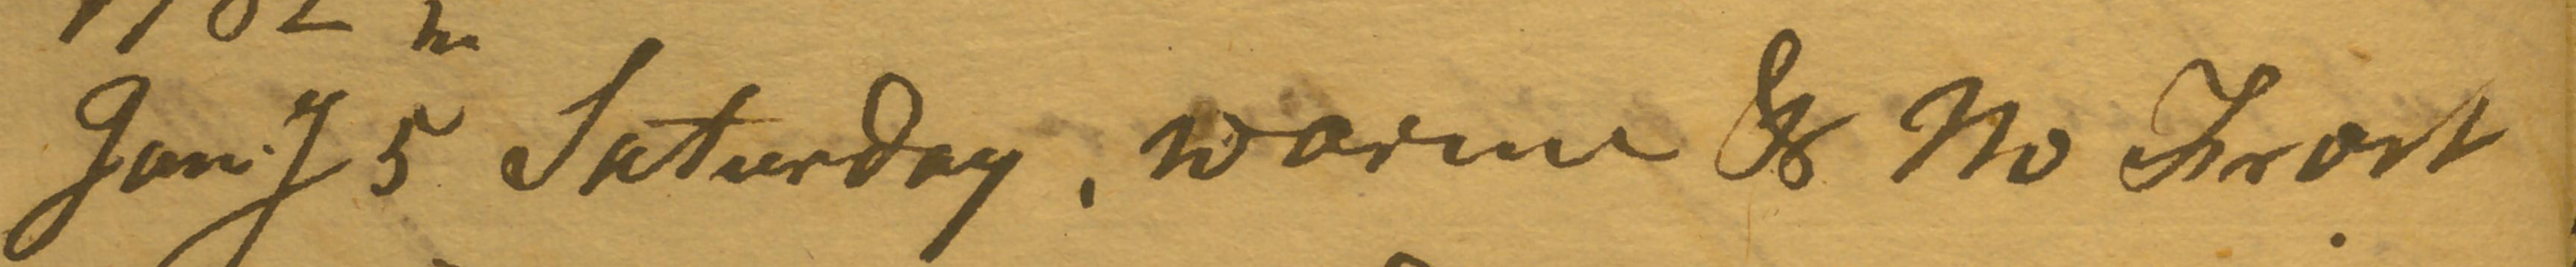Jan^y. 5^th Saturday, warme & No Frost
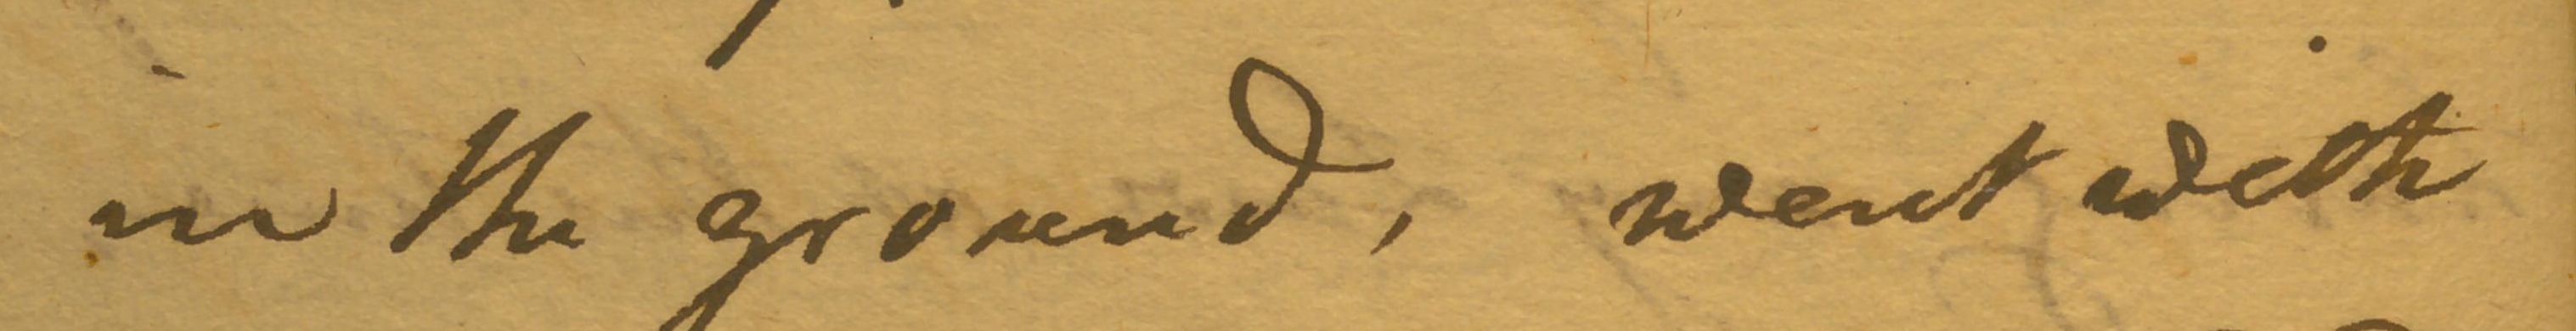in the ground, went with
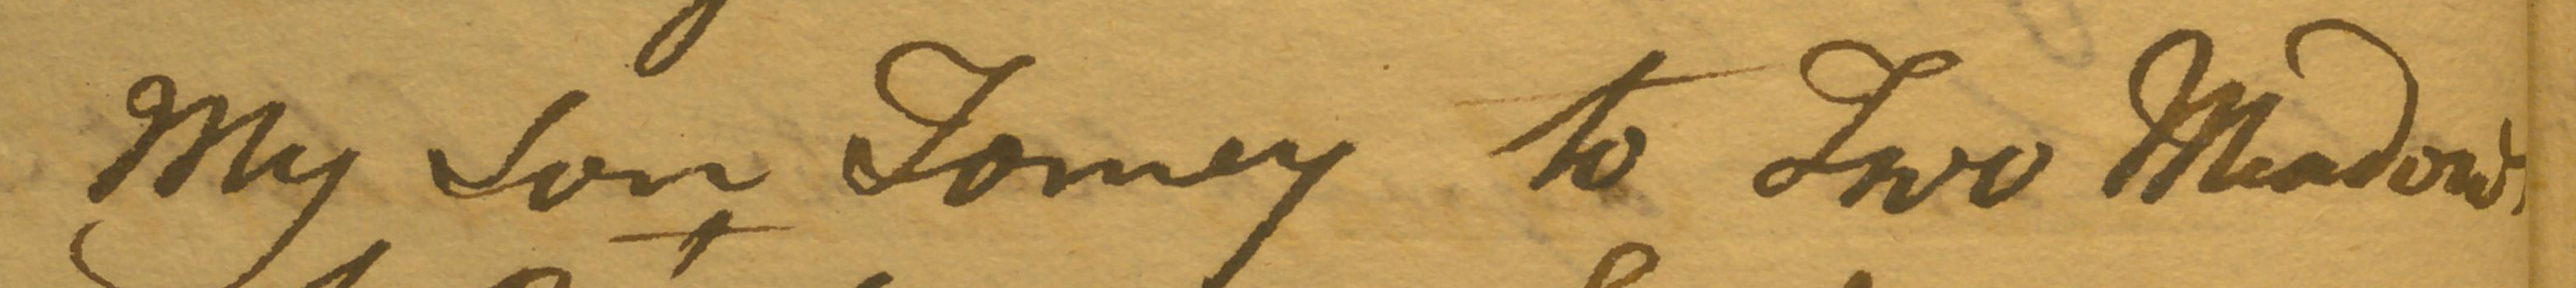My son Tomey to Two Meadow
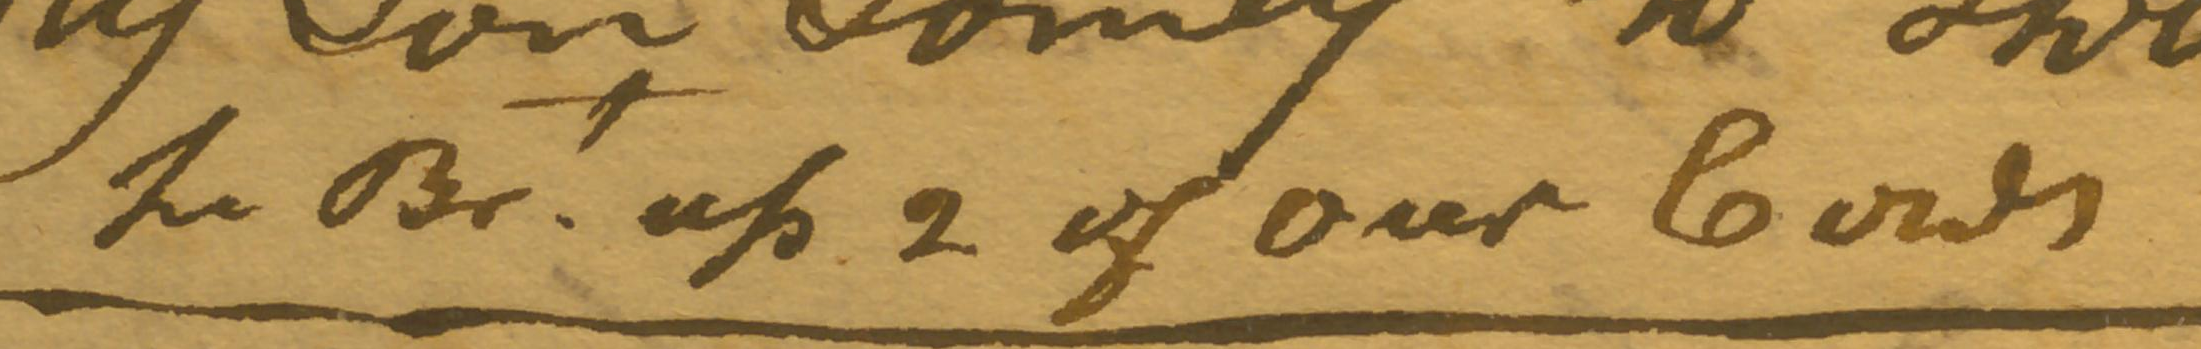he Br^t. up 2 of our Cows
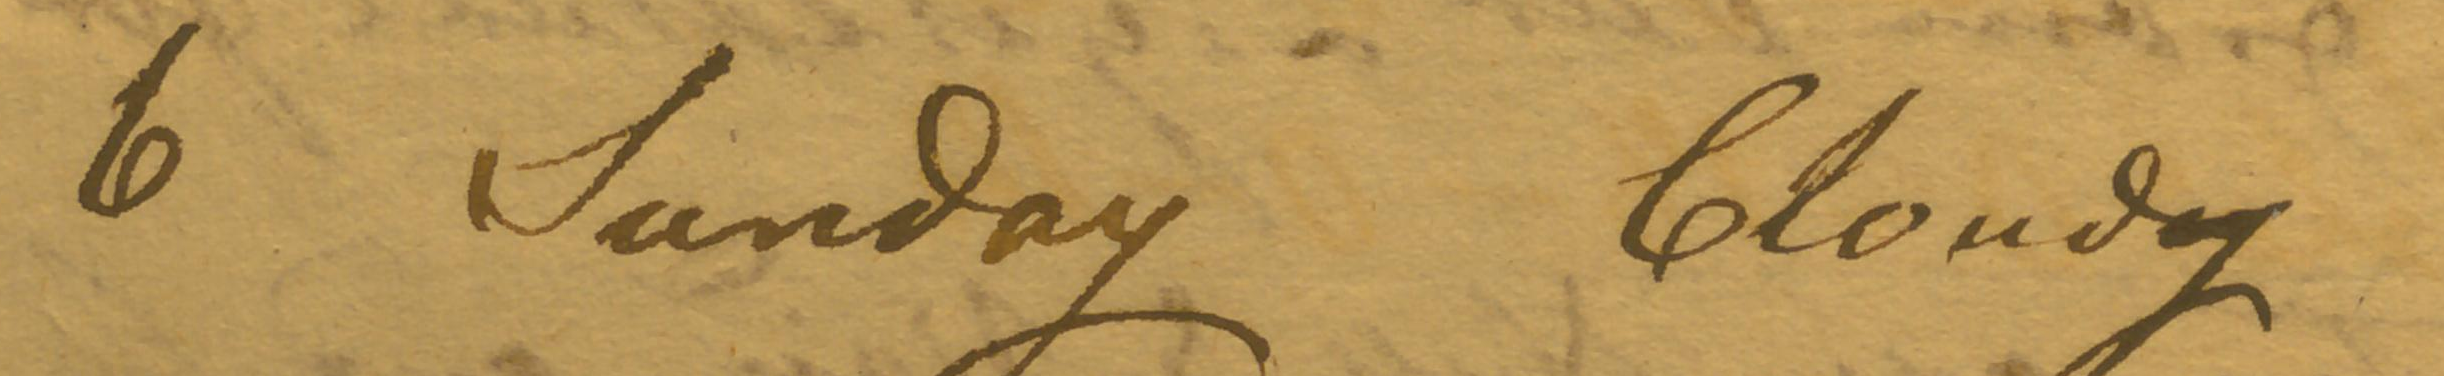6 Sunday Cloudy
